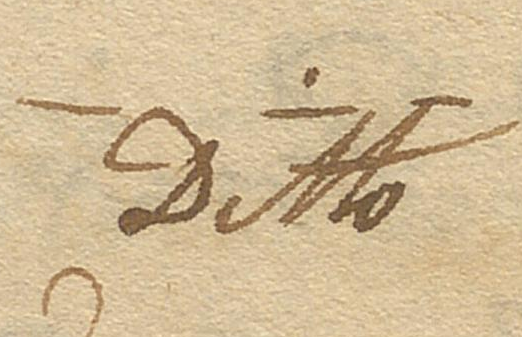Ditto
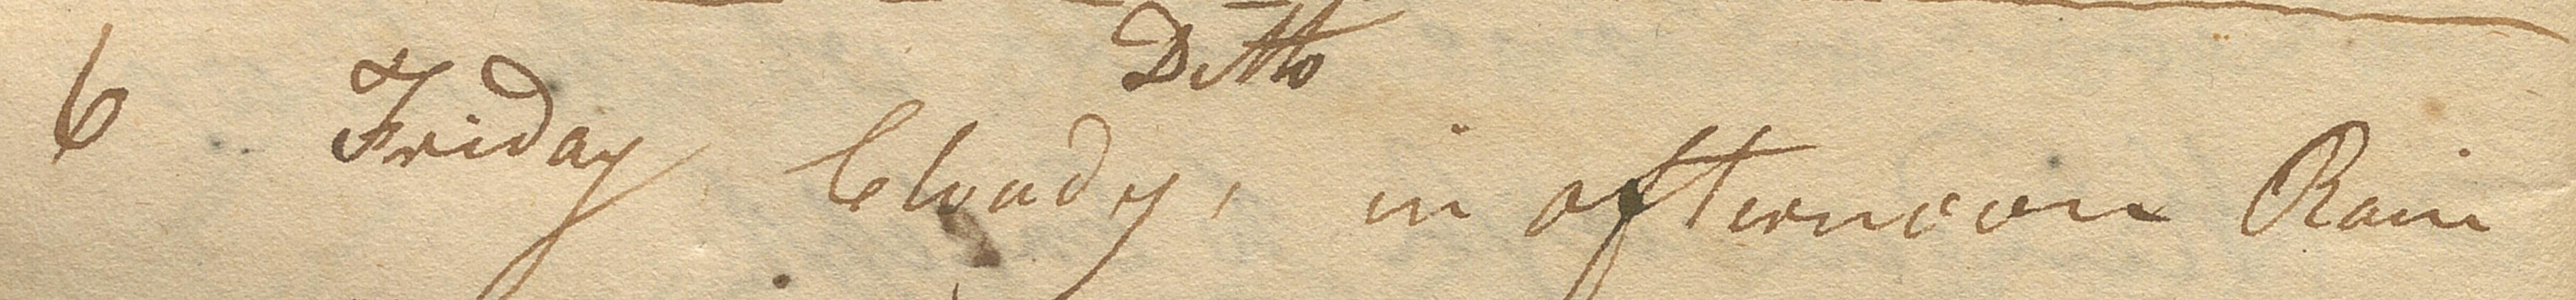6 Friday Cloudy, in afternoon Rain
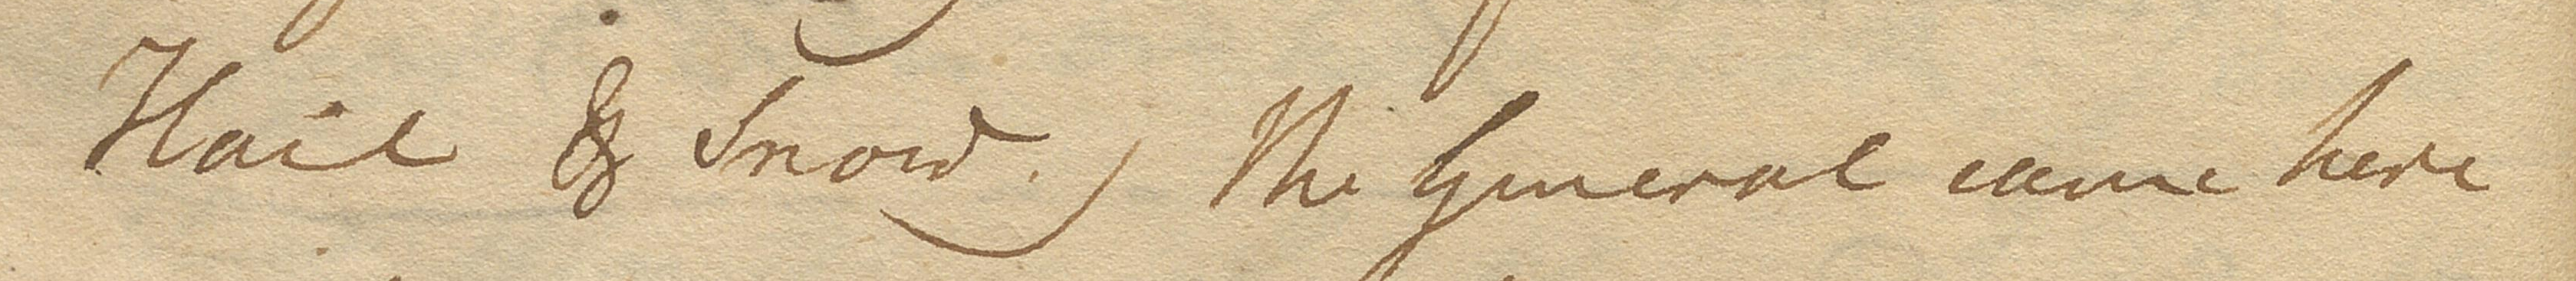Hail & snow) the General came here
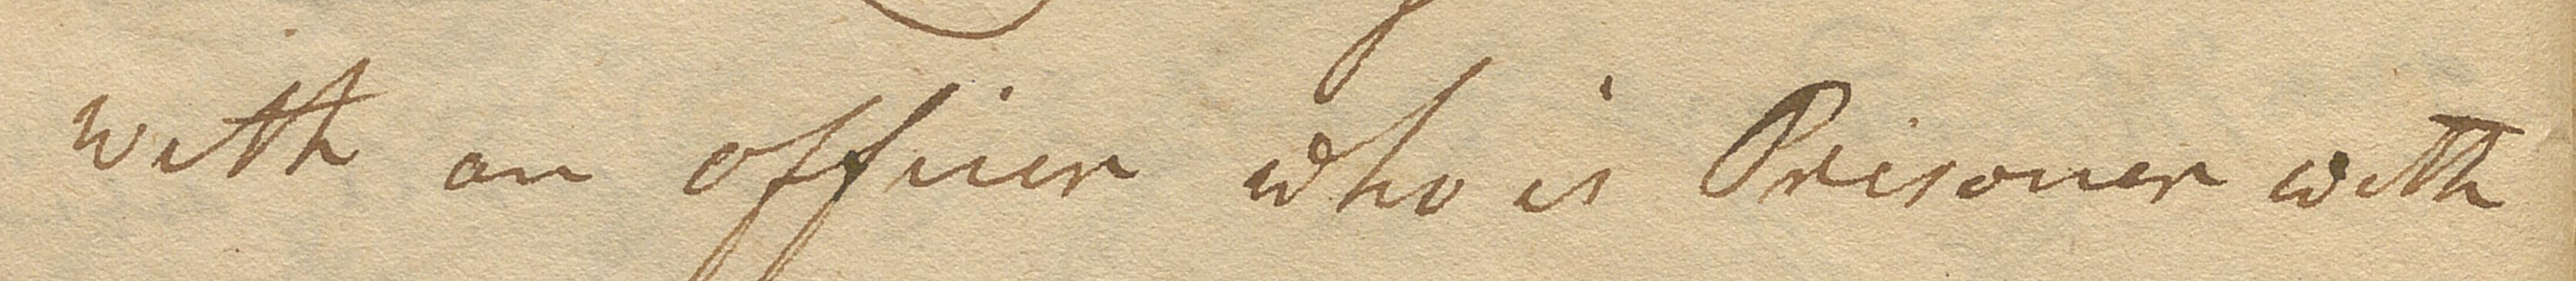with an officer who is Prisoner with
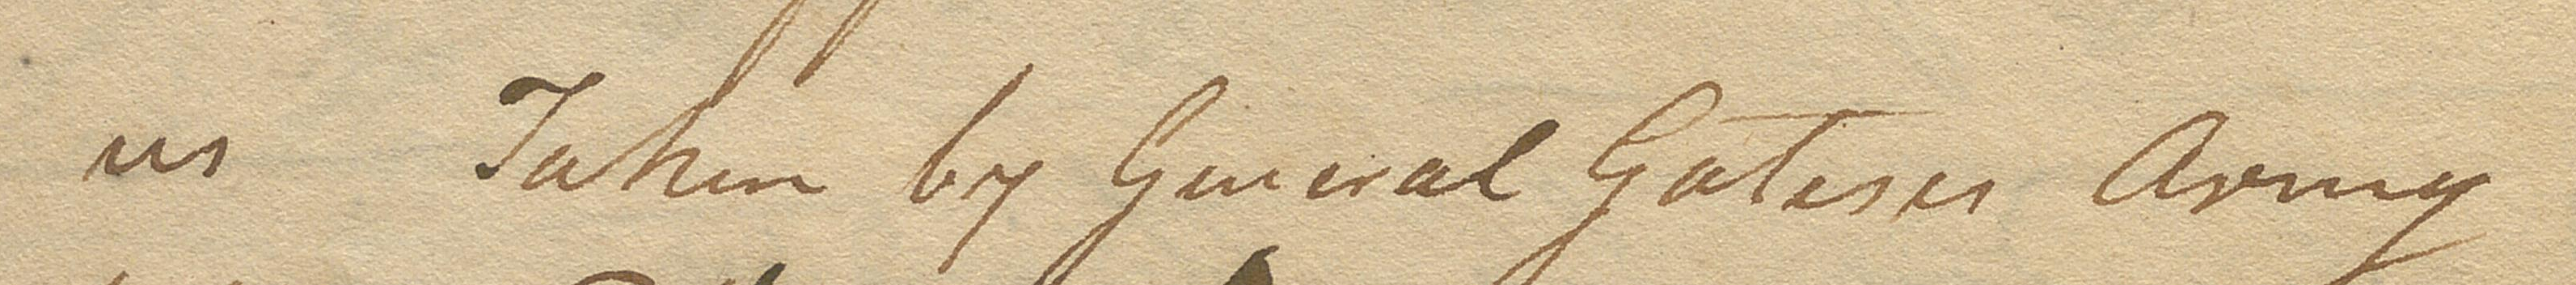us Taken by General Gateses Army
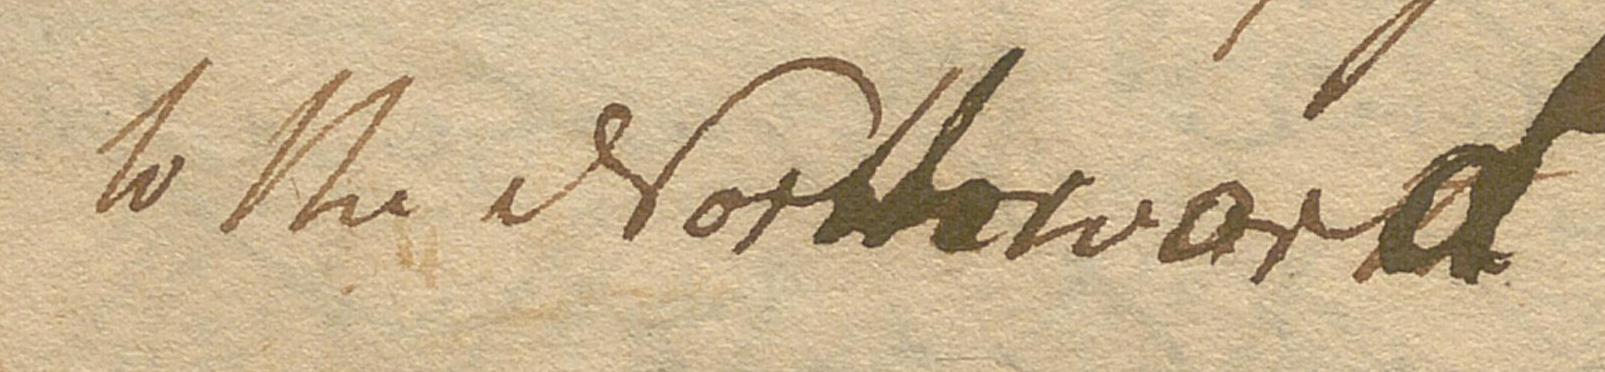to the Northward
